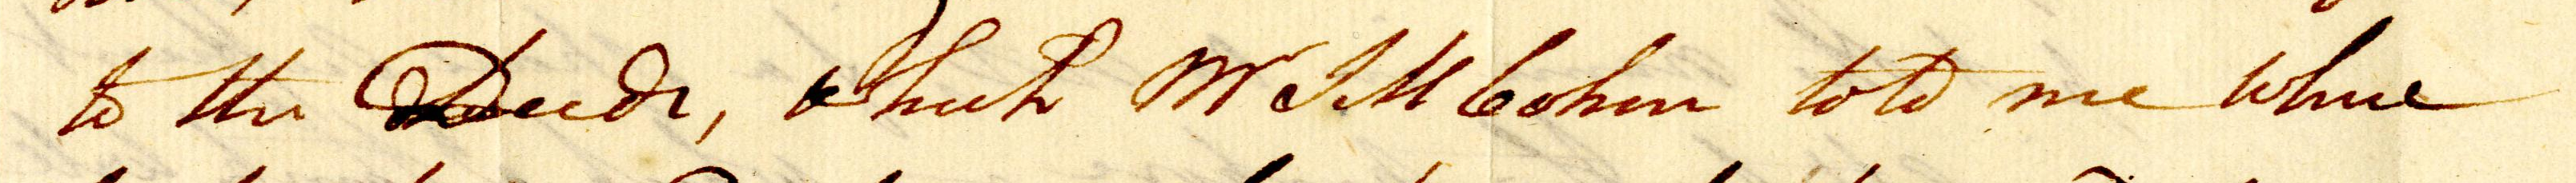to the Deeds, which M^r J M Cohen told me where
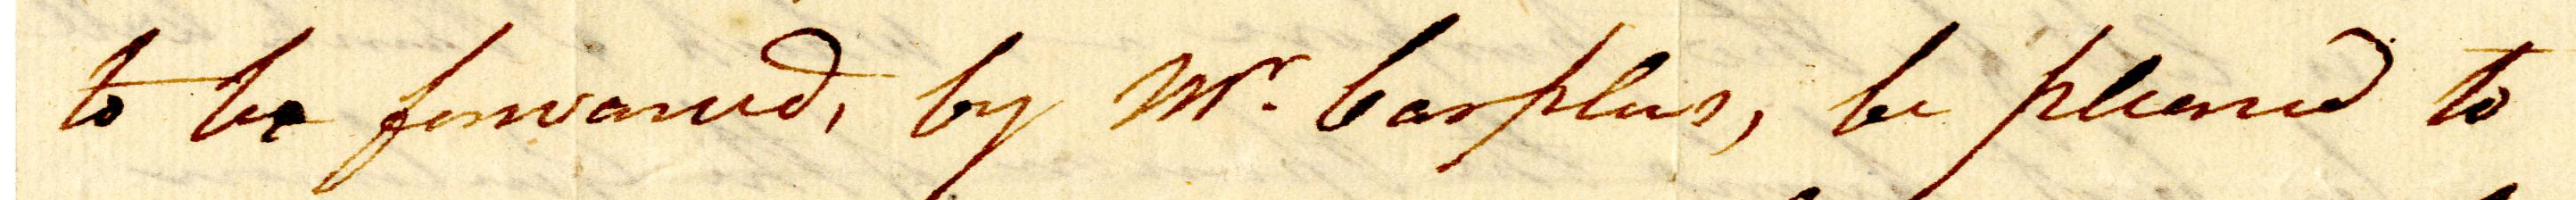to be forwared, by M^r. Carplas, be pleased to
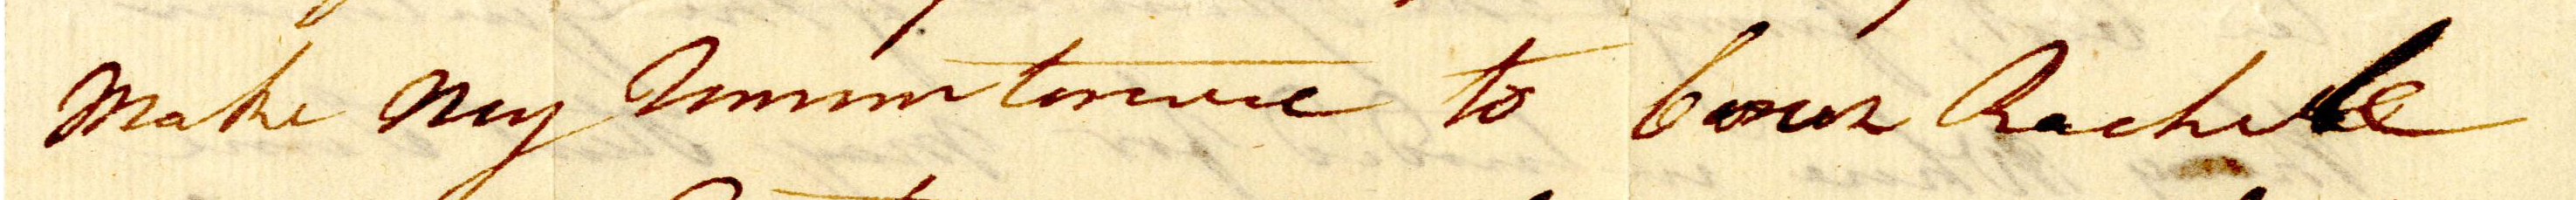make my remimterence to Couz Rachale
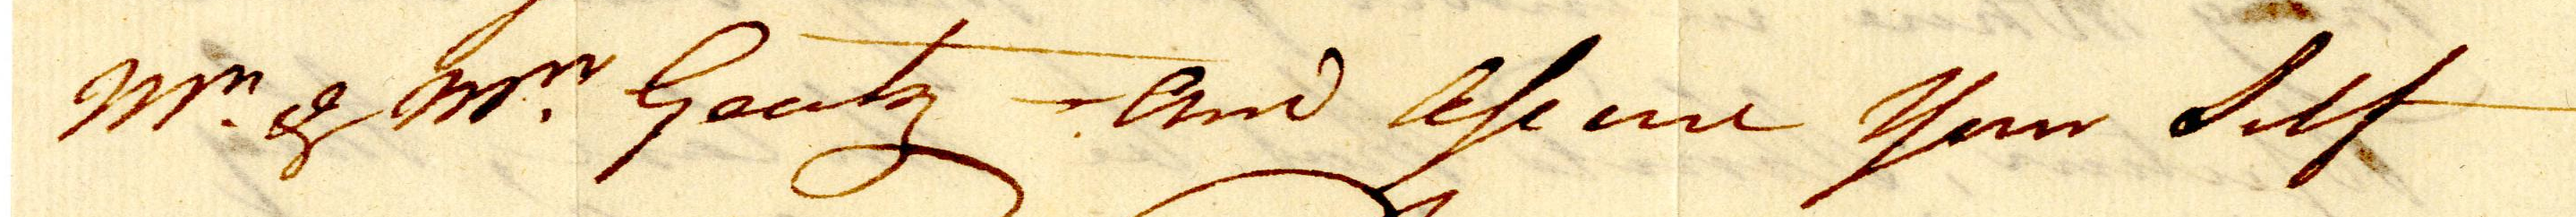M^r. & M^rs. Gratz and assure your self
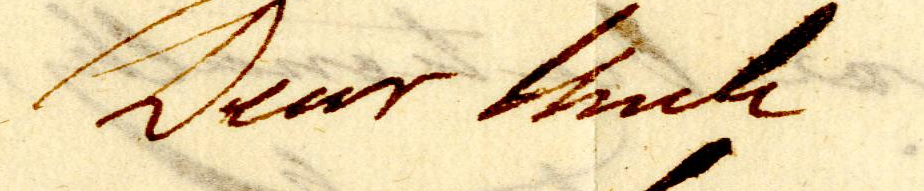Dear Uncle
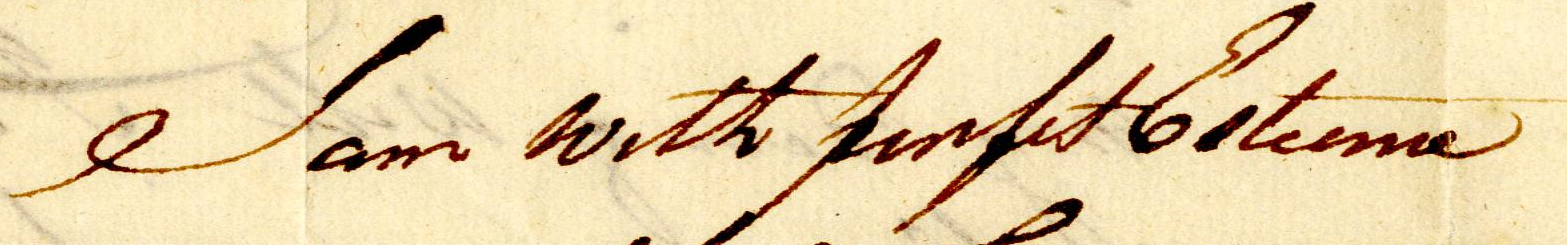I am with perfect Esteeme
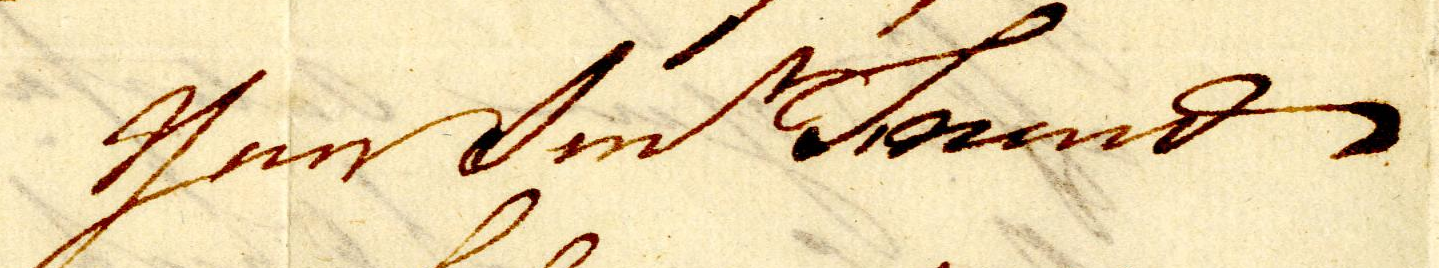Your loy^l servent
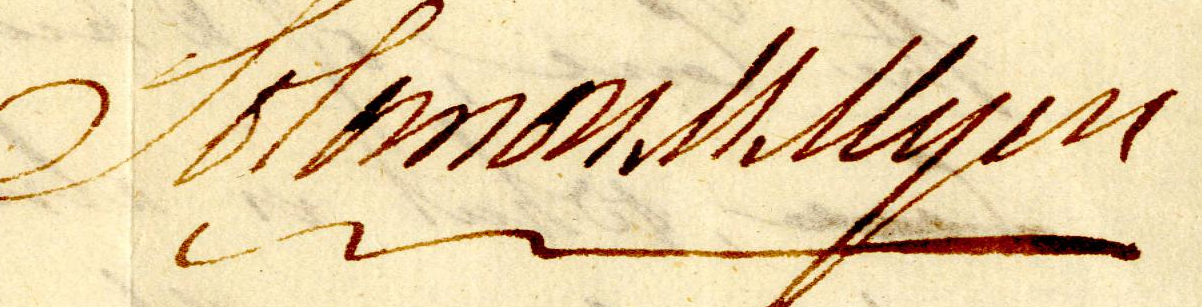Solomon M Myers
